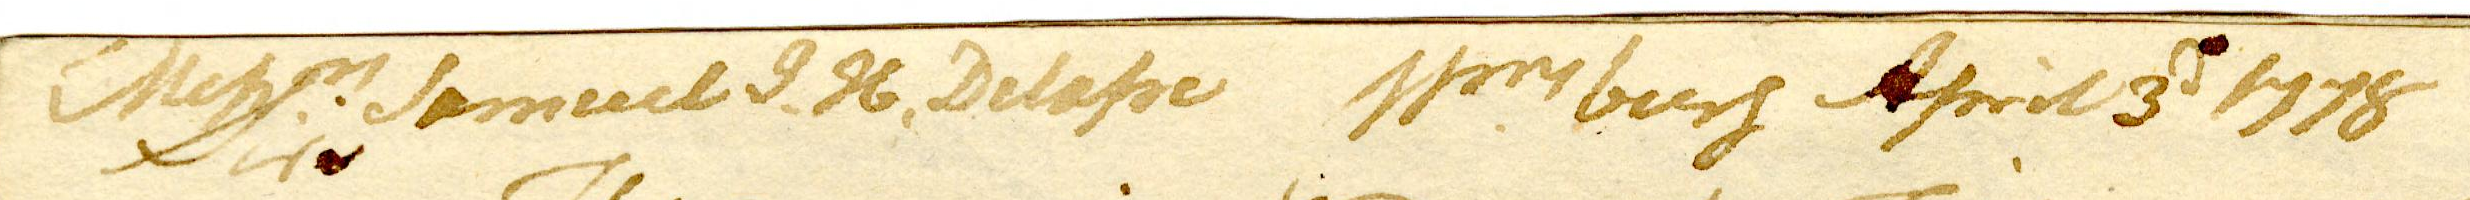Mess^rs Samuel J H Delasse W^msberg April 3^d 1778
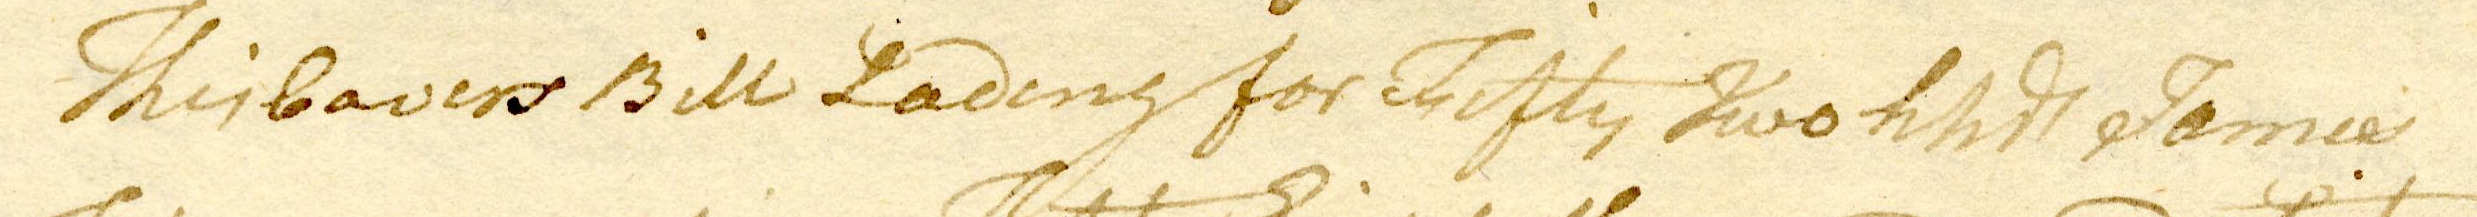This covers Bill Lading for Fifty Two hhds James
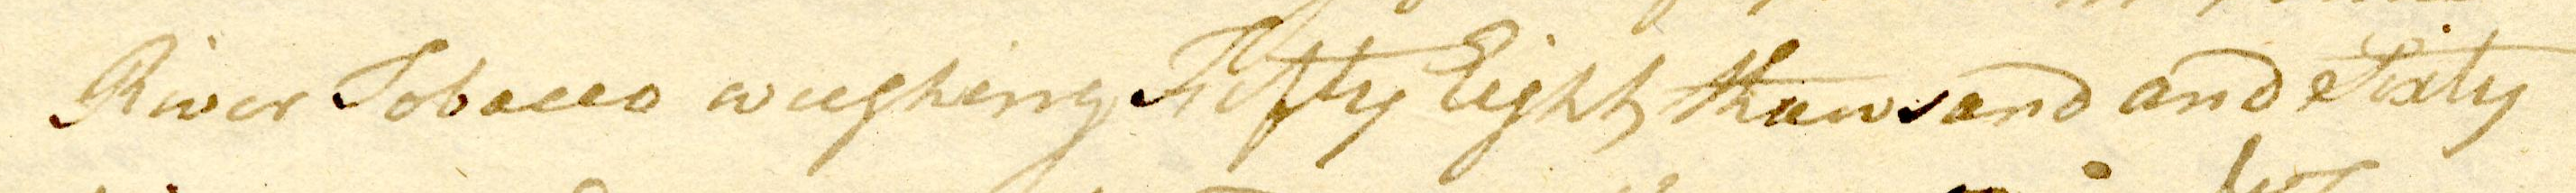River Tobacco weighing Fifty Eight thousand and Sixty
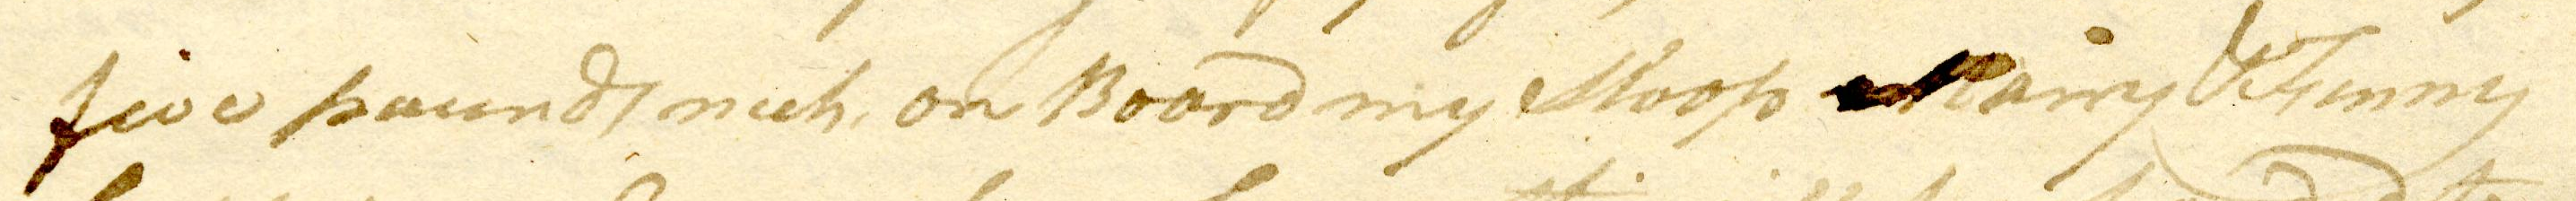five pounds much on Board my sloop Marry & Fanny
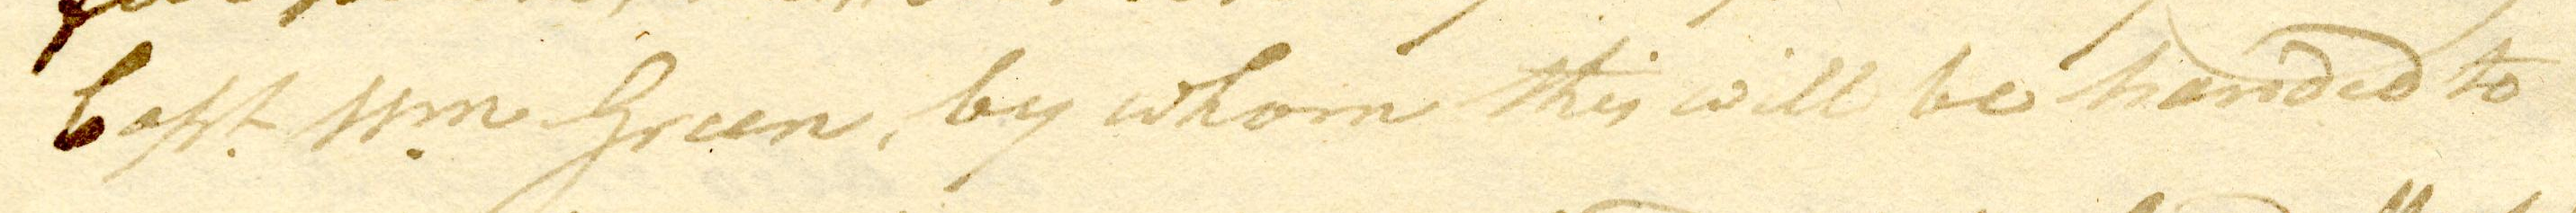Capt W^m Green, by whom this will be handed to
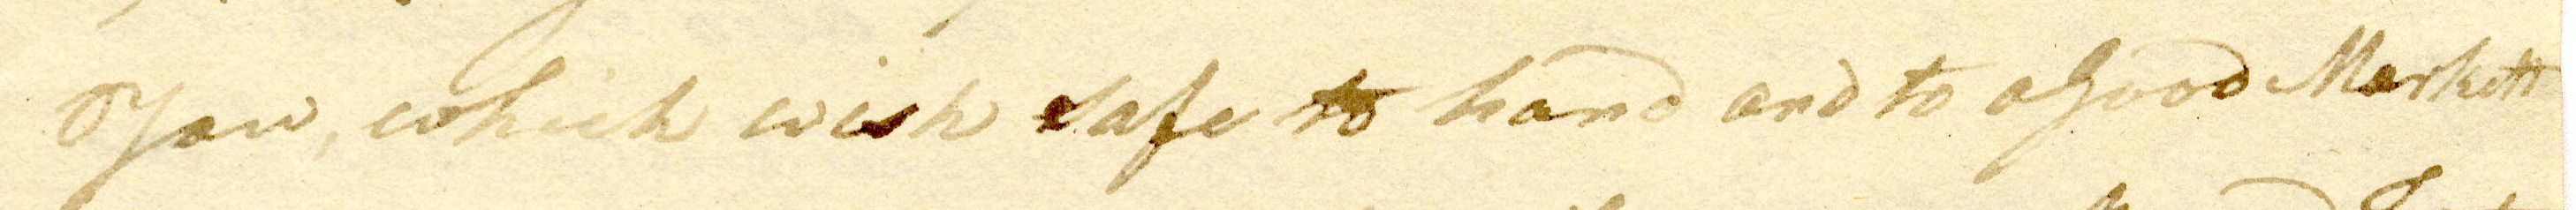you, which wish safe to hand and to a Good Markets
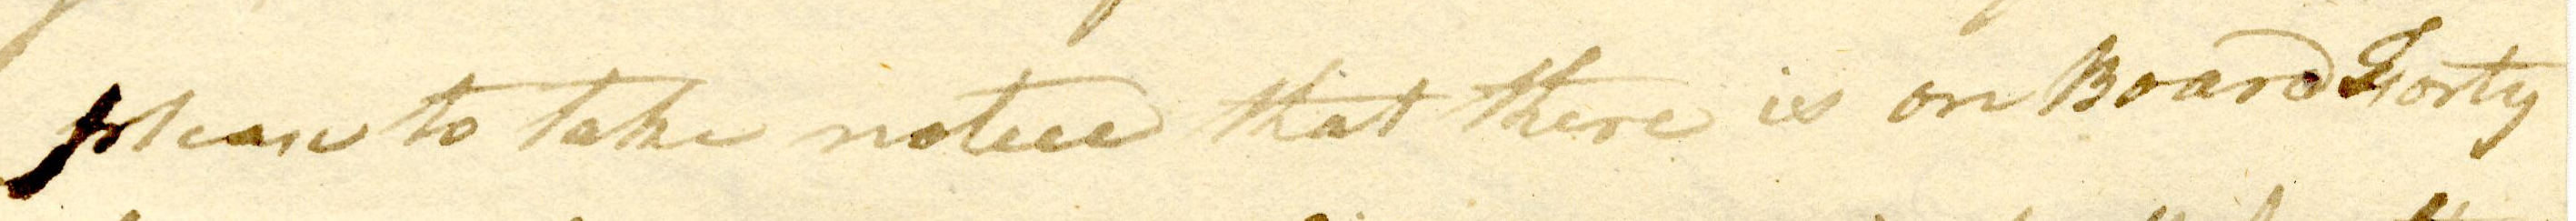please to take notice that there is on Board Forty
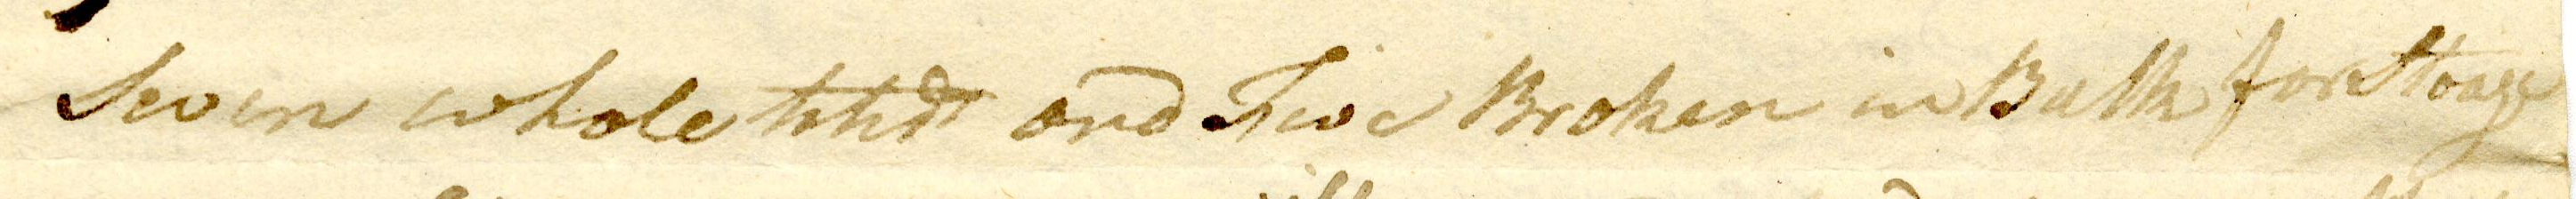seven whole hhds and Five Broken in Bulk for Stoage
